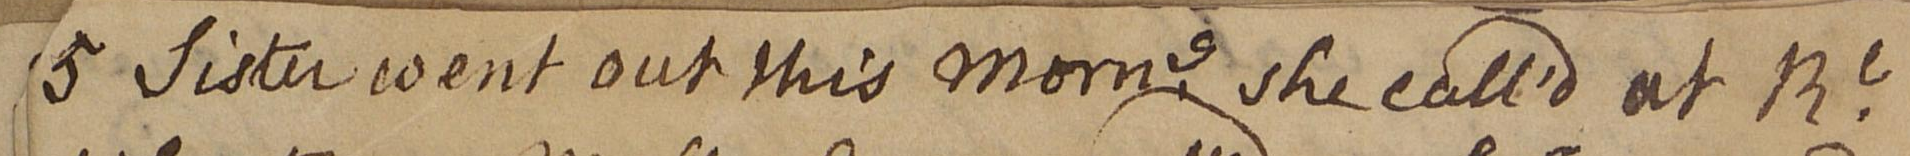5 Sister went out this Morn^g. she call'd at R^l.
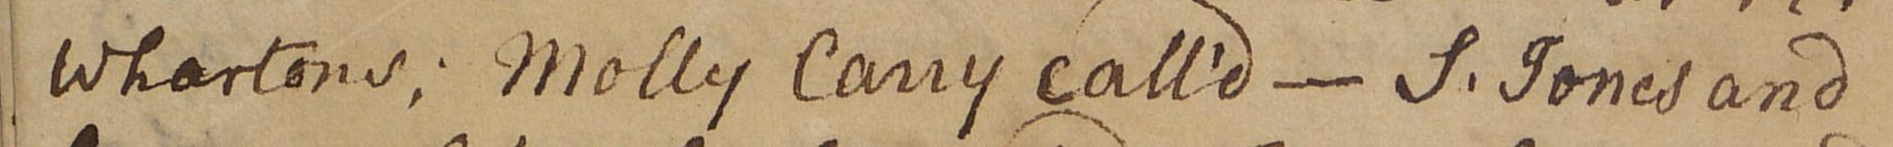Whartons; Molly Carry call'd- S. Jones and
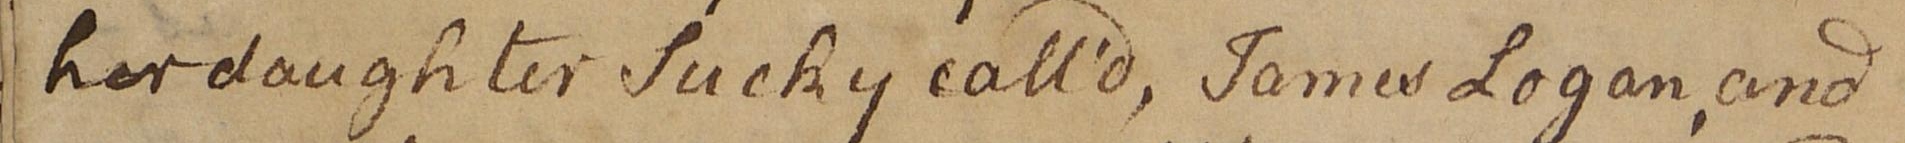her daughter Sucky call'd, James Logan, and
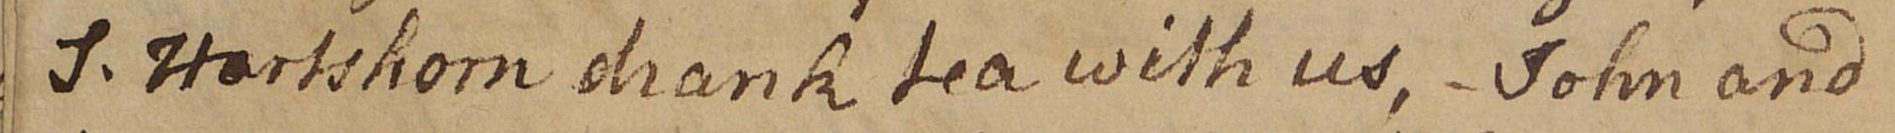S. Hartshorn drank tea with us,- John and
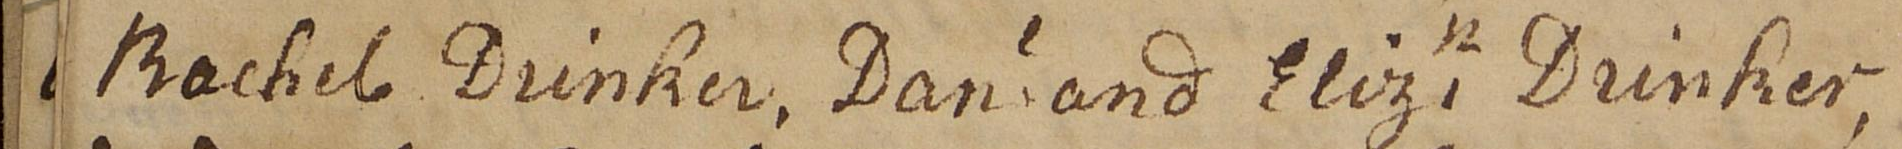Rachel Drinker, Dan^l. and Eliz^th. Drinker,
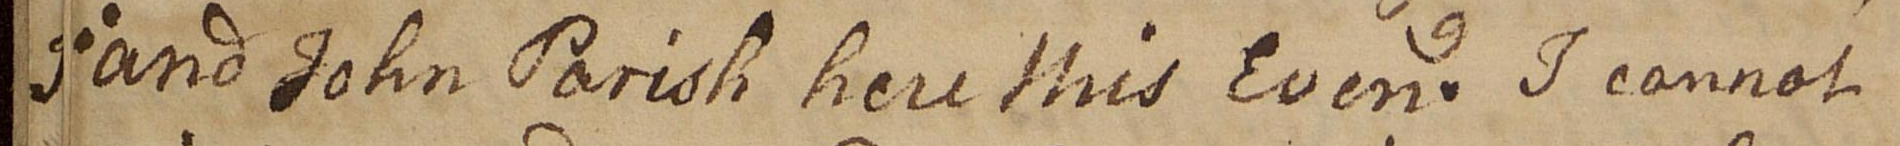and John Parish here this Even^g. I cannot
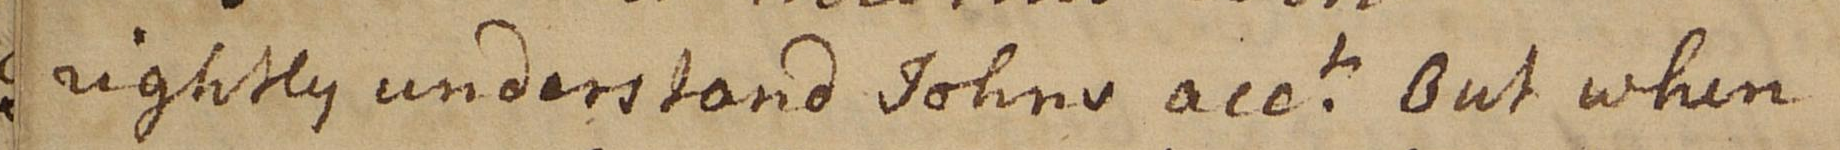rightly understand Johns acc^t. But when
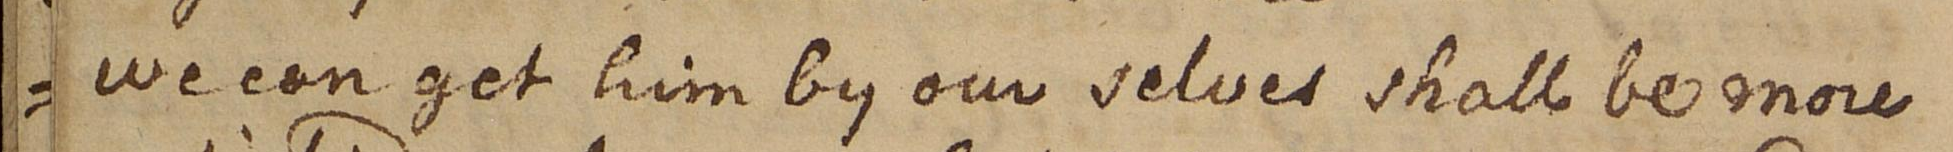we can get him by our selves shall be more
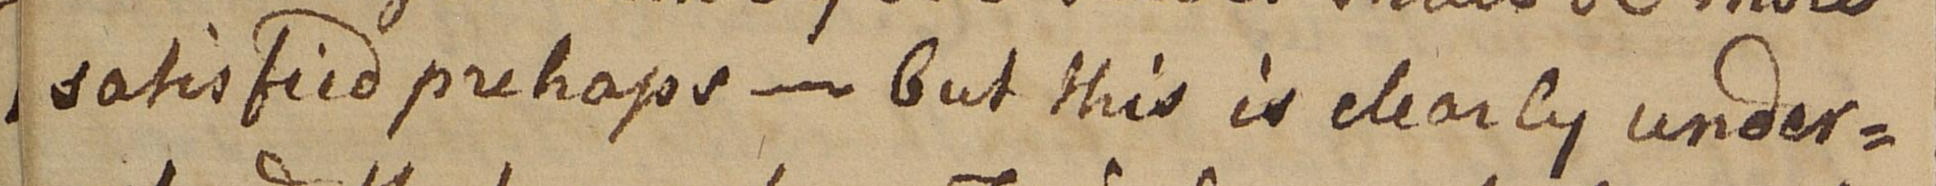satisfied prehaps- but this is clearly under-
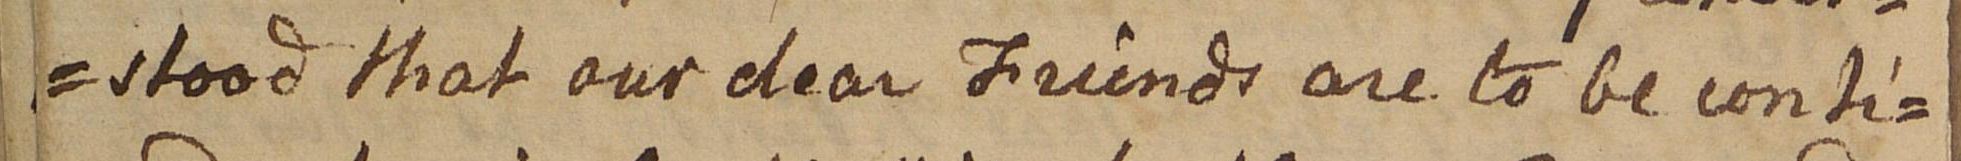-stood that our dear Friends are to be conti-
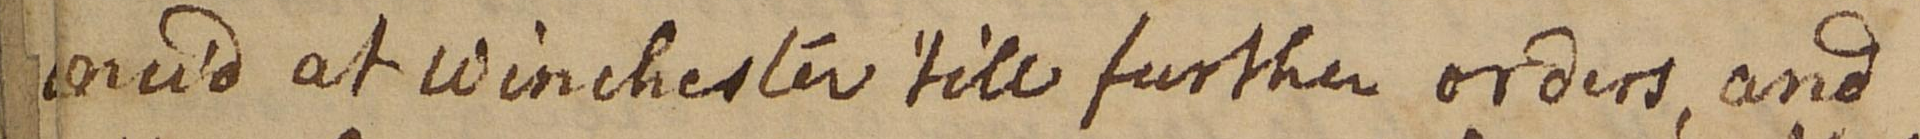nu'd at Winchester till further orders, and
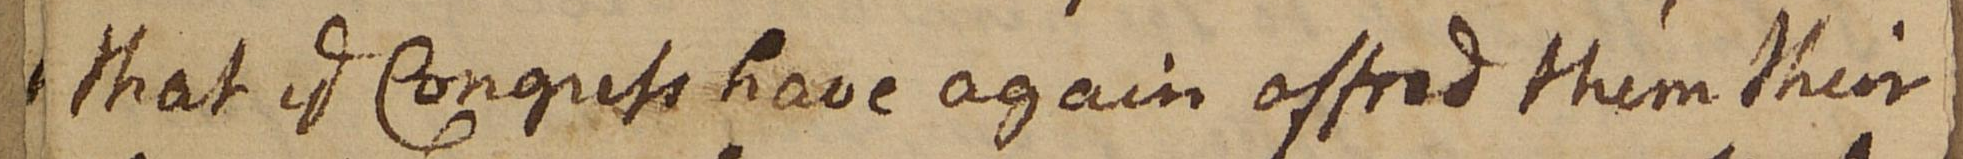that y^e Congress have again offred them their
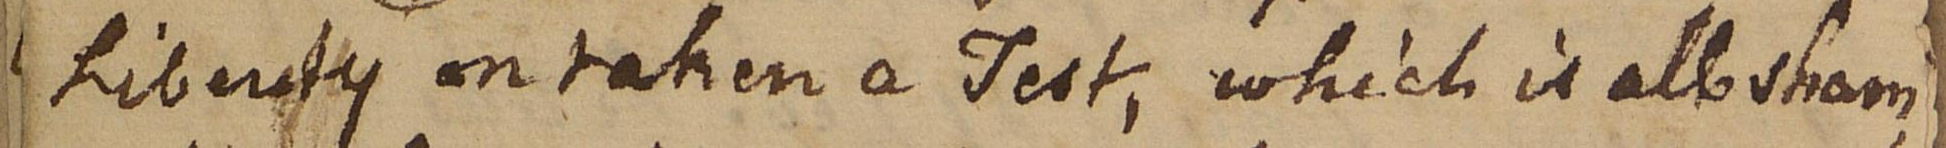Liberty on taken a Test, which is all sham,
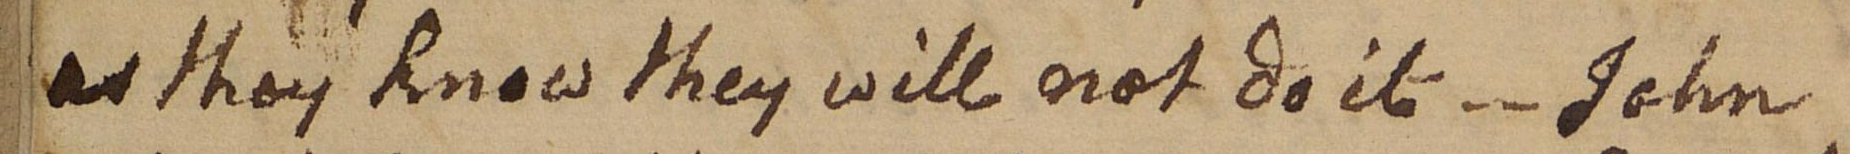as they know they will not do it- John
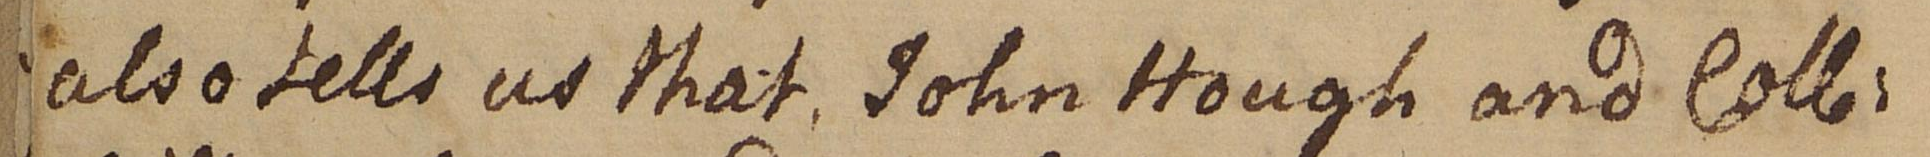also tells us that John Hough and Coll^s
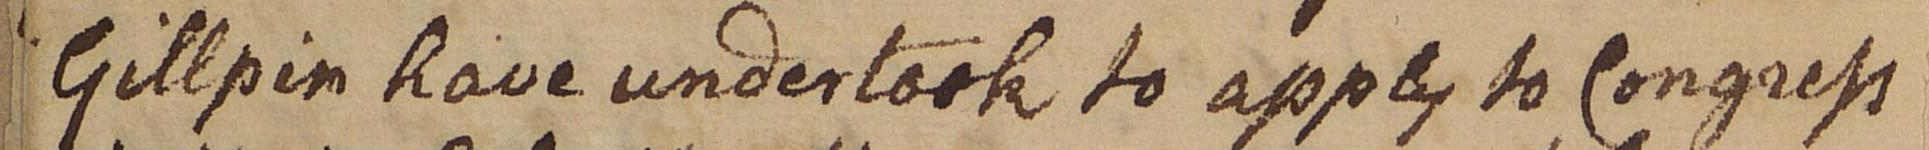Gillpin have undertook to apply to Congress
